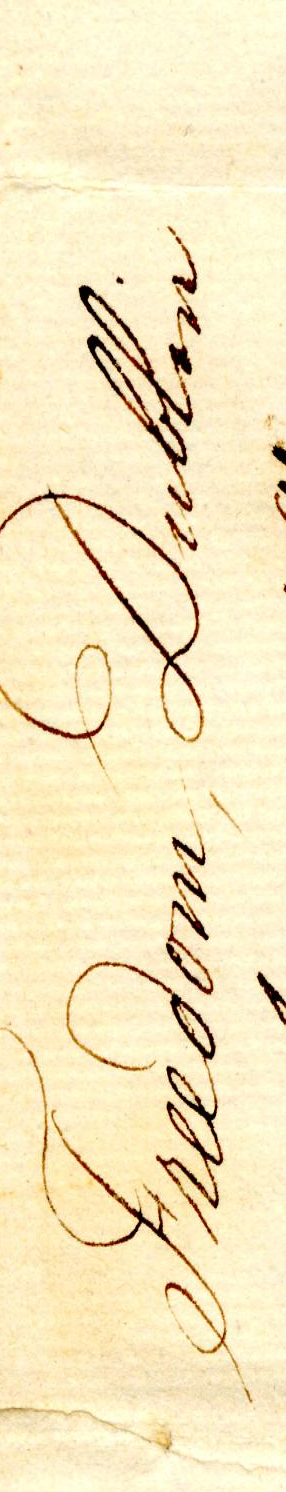Freedom Dublin
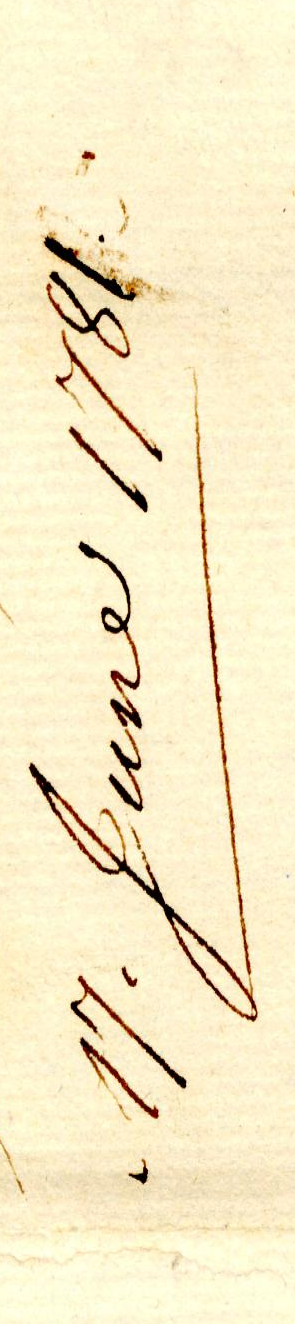17. June 1781
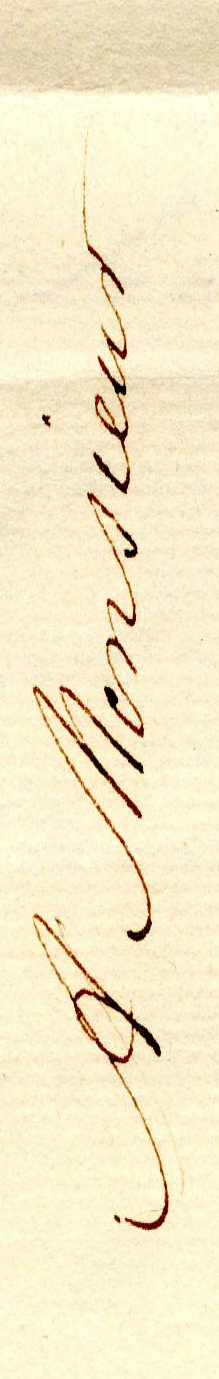A Monsieur
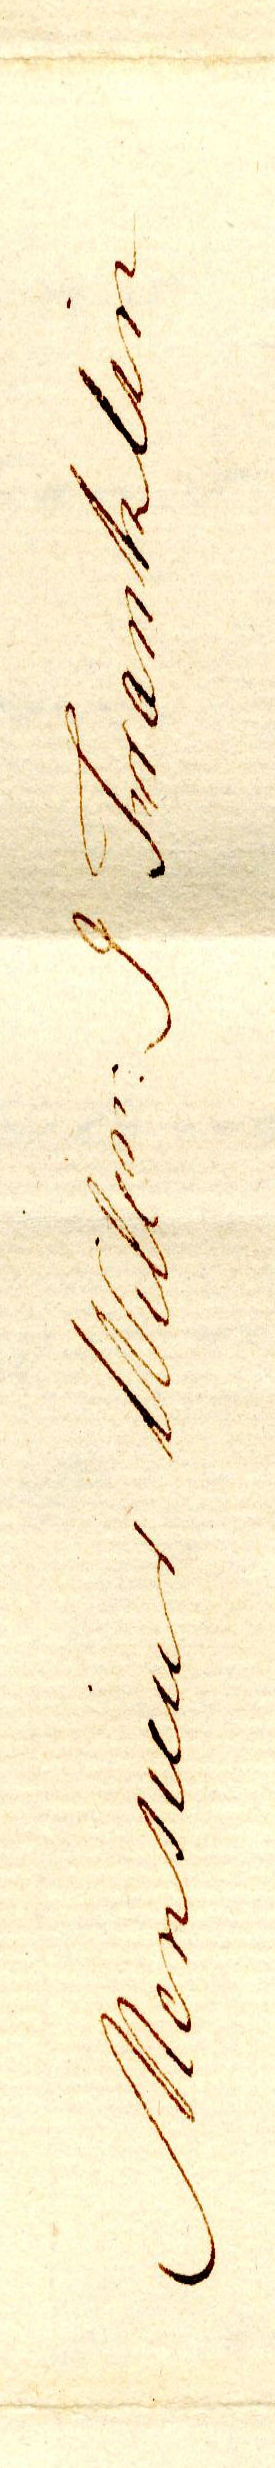Monsieur Will^m. T Franklin
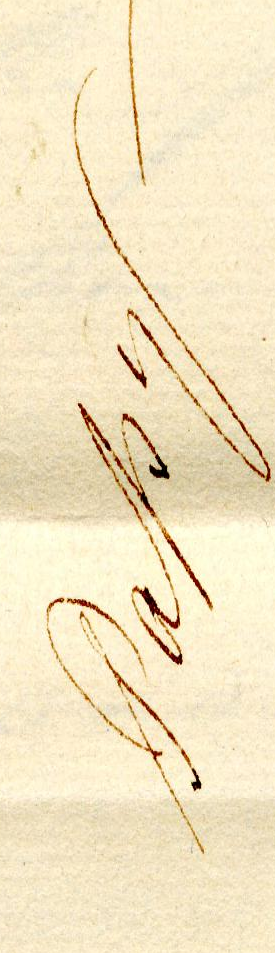Passy
